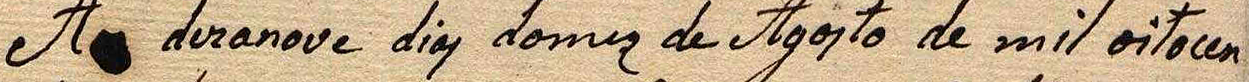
A_ dezanove dias do mez de Agosto de mil oitocen
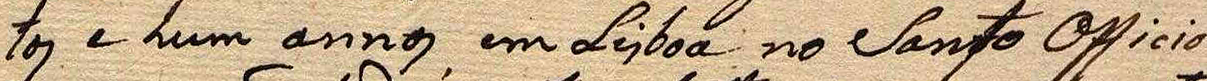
to e hum annos, em Lisboa no Santo Officio
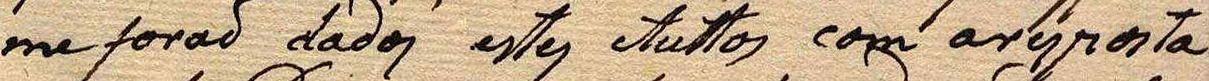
me foraõ dados esttes Auttos com a resposta
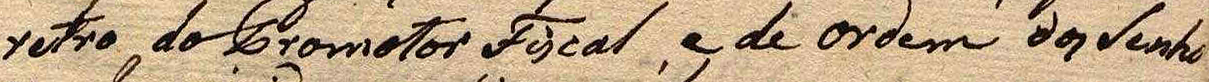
retro do Promotor Fiscal, e de ordem dos Senho
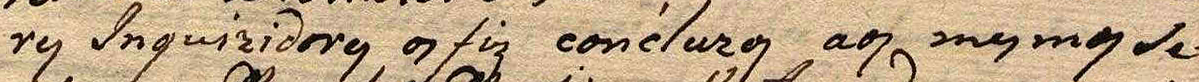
res Inquizidores os fiz concluzos aos mesmos Se
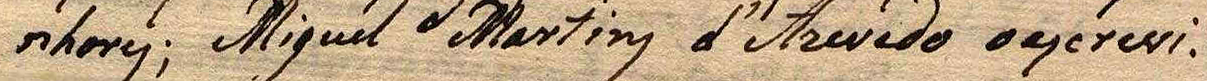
nhores; Miguel Martins d'Azevedo o escrevi:
